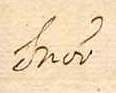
Snor̄
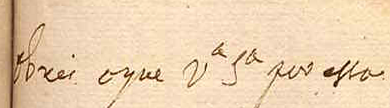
Obrei o que Va Sa por esta
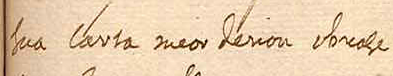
sua carta me ordenou obrase
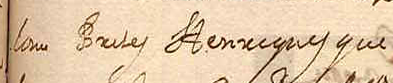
com Brites Henriques que
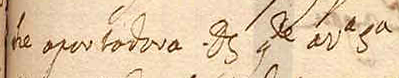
he a portadora. Ds gde a Va Sa
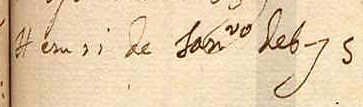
Il̄ em 11 de Ianro de 675
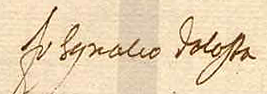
fr Ignacio da costa
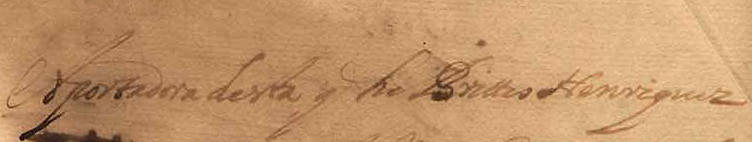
A portadora desta q̄ he Brittes Henriquez
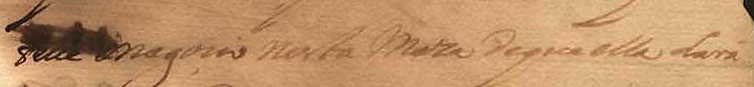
teue o negocio nesta meza de que ella dará
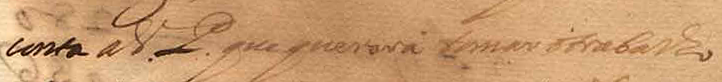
conta a V. P. que querera tomar o trabalho
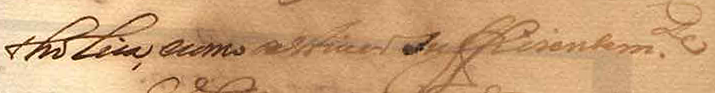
tholica, e como o estiueraõ sufficientem.te
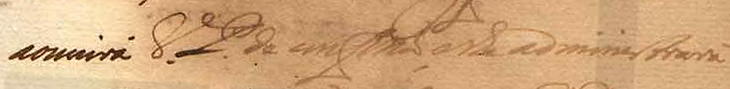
a ouuira V.a P de confissaõ, e lhe administrará
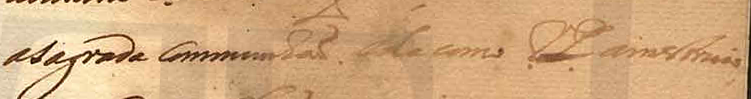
a sagrada communhaõ. e de como V. P. a instruio,
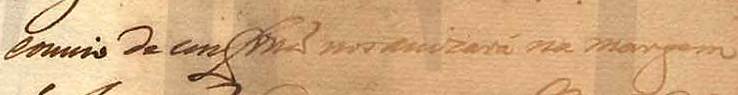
e ouuio de confissaõ nos auizará na margem
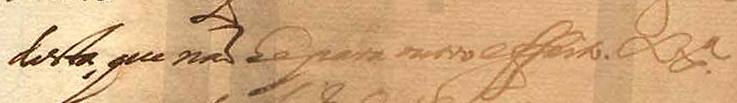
desta, que naõ he para outro effeito. Lx.a
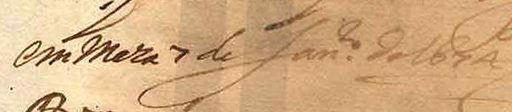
em meza 7 de Janro. de 1674
